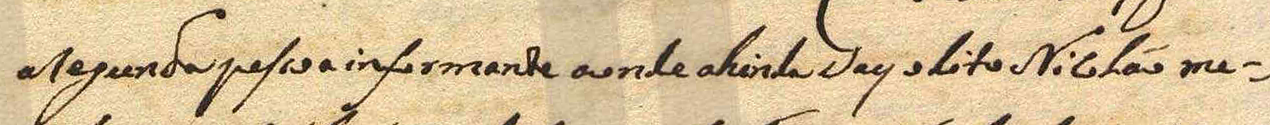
a segunda pessoa informante aonde ahinda vey o dito Nicoláo me
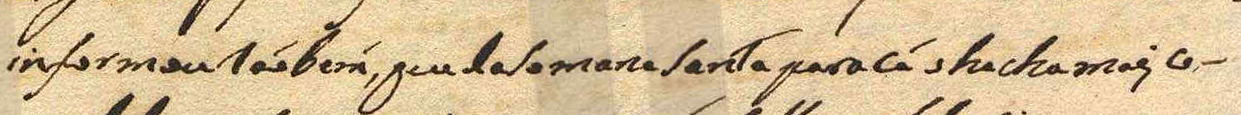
informou taõbem̄, que da somana santa para cá s hacha mais co
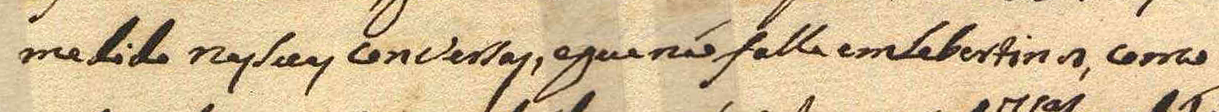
medido nas suas conversas, e que naõ falla em lebertinos, como
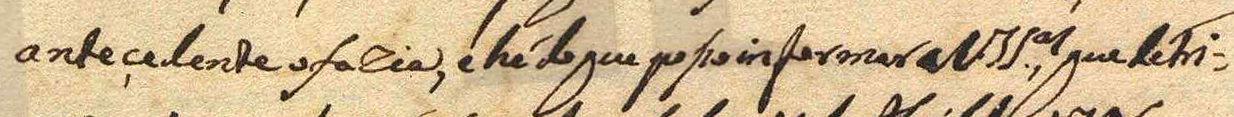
anteçedente o fazia, e hé do que posso informar a VSS.as, que detri
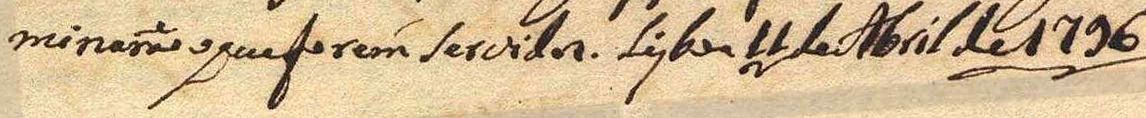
minaraõ o que forem̄ servidos. Lisboa 11 de Abril de 1796
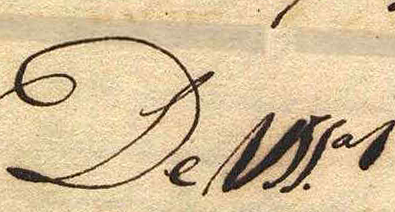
De VVSS.as
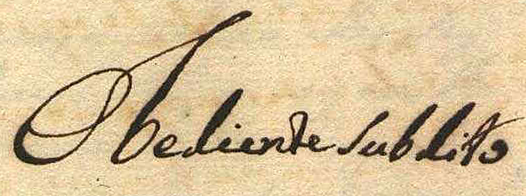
Obediente subdito
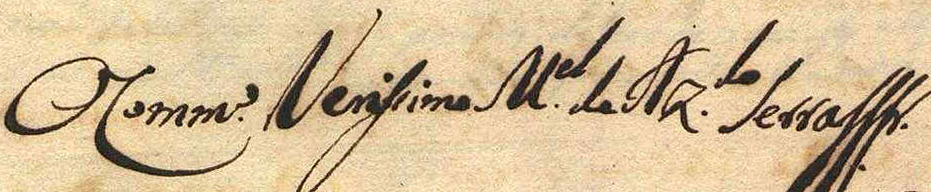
O Comm.o Verisimo M.el de Az.do Serra
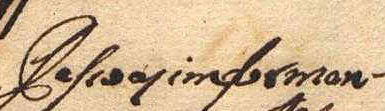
Pessoas imforman
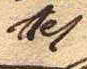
tes
